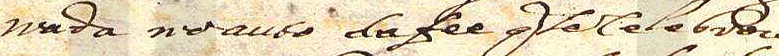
nada no auto da fee q̄ se celebrou
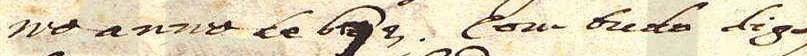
no anno de 6_3. Com tudo digo_
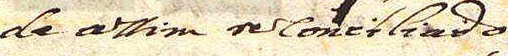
da assim reconciliado;
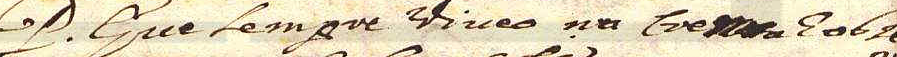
P. Que sempre Viueo na Crenca E obse_
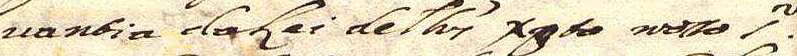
uansia da Lei de Ihs̄ xpto nosso sor.
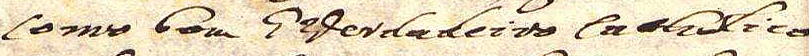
Como bom E Verdadeiro Catholico
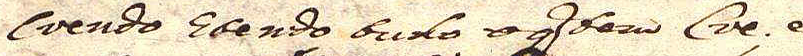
Crendo E tendo tudo o q̄ tem Cre, e
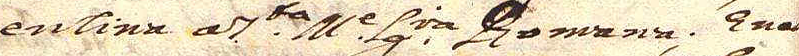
enCina a sta. Me. Igra. Romana; E na_
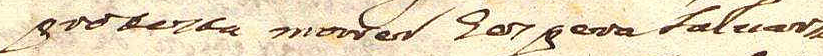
protesta morrer E espera saluarss_
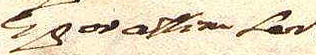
E por assim ser.
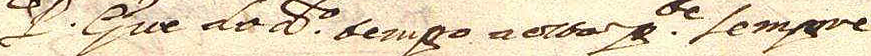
P. Que do d̄o. tempo a esta pte. sempre
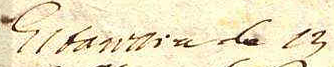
Estanssia de 13
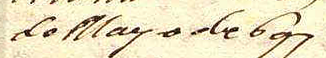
de Mayo de 697
